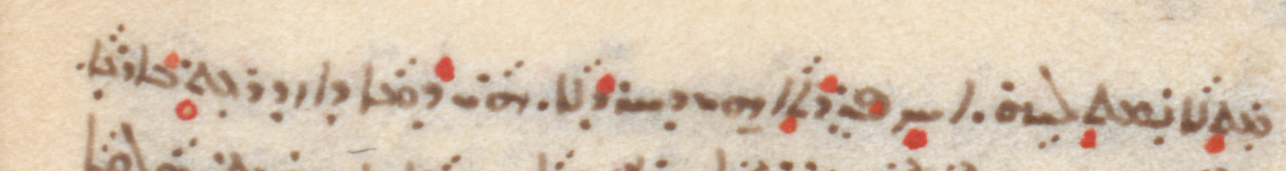ܡܬܠܐ ܢܡܬܠܝܗ̇. ܐܝܟ ܦܪܕܬܐ ܗܝ ܕܚܪܕܠܐ. ܗ̇ܝ ܕܡܐ ܕܐܙܕܪܥܬ ܒܐܪܥܐ܆
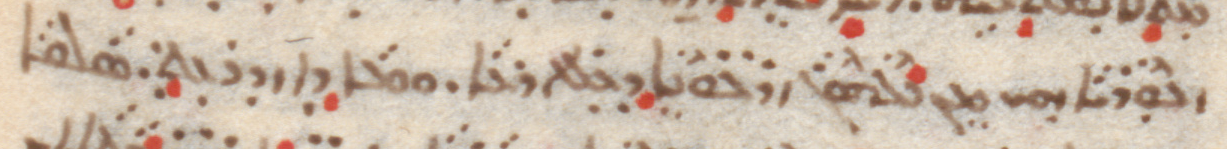ܙܥܘܪܝܐ ܗܝ ܡܢ ܟܠܗܘܢ ܙܪ̈ܥܘܢܐ ܕܥܠ ܐܪܥܐ. ܘܡܐ ܕܐܙܕܪܥܬ܆ ܣܠܩܐ
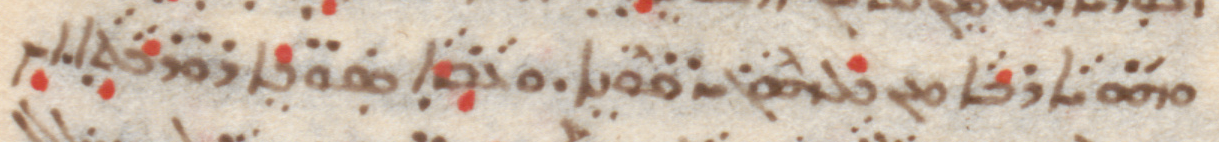ܘܗ̇ܘܝܐ ܪܒܐ ܡܢ ܟܠܗܘܢ ܝܪ̈ܩܘܢܐ. ܘܥ̇ܒܕܐ ܣܘ̈ܟܐ ܪ̈ܘܪܒܬܐ܆ ܐܝܟ
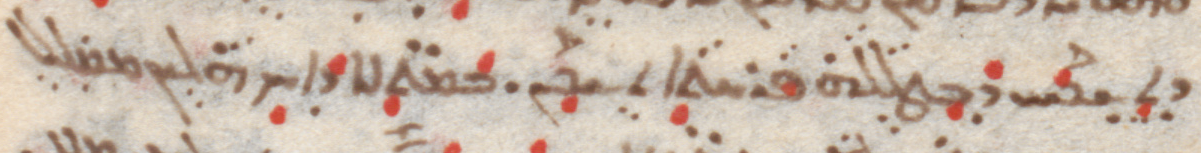ܕܬܫܟܚ ܕܒܛܠܠܗ̇ ܦܪܚܬܐ ܬܫܟܢ. ܒܡ̈ܬܠܐ ܕܐܝܟ ܗ̇ܠܝܢ ܡܡܠܠ
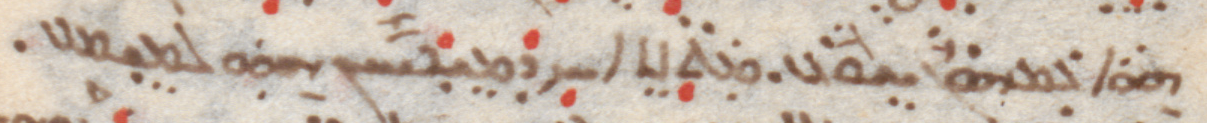ܗܘܐ ܥܡܗܘܢ ܝܫܘܥ. ܡܬ̈ܠܐ ܐܝܟ ܕܡܫܟܚܝܢ ܗܘܘ ܠܡܫܡܥ.
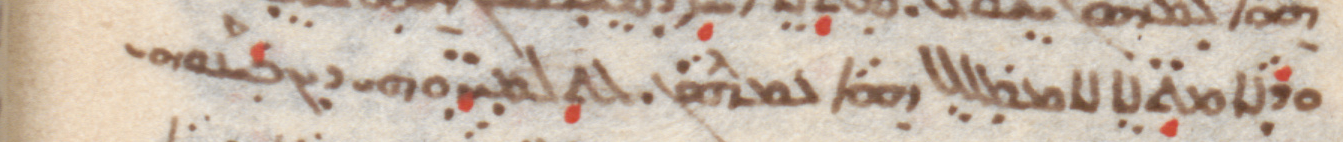ܘܕܠܐ ܡܬ̈ܠܐ ܠܐ ܡܡܠܠ ܗܘܐ ܥܡܗܘܢ. ܠܬܠܡܝܕ̈ܘܗܝ ܕܝܢ ܒܝܢܘܗܝ
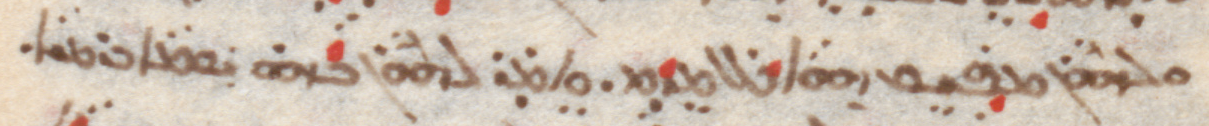ܘܠܗܘܢ ܡܦܫܩ ܗܘܐ ܟܠ ܡܕܡ. ܘܐܡ̣ܪ ܠܗܘܢ ܒܗ̇ܘ ܝܘܡܐ ܒܪܡܫܐ.
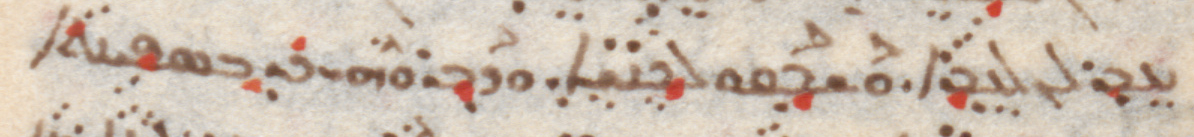ܢܥܒܪ ܠܢ ܠܥܒܪܐ. ܘܫܒ̣ܩܘ ܠܟܢ̈ܫܐ܆ ܘܕܒܪܘܗܝ ܟܕ ܒܣܦܝܢܬܐ
